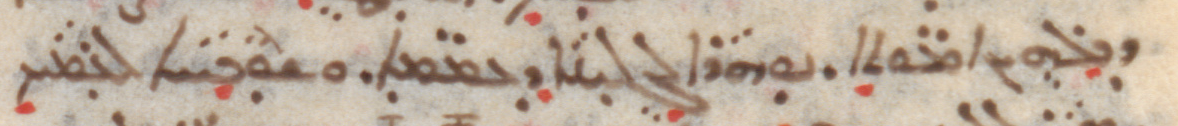ܕܟܠܗܝܢ ܐܡ̈ܘܬܐ. ܢܘܗܪܐ ܠܓܠܝܢܐ ܕܥܡ̈ܡܐ܆ ܘܫܘܒܚܐ ܠܥܡܟ
